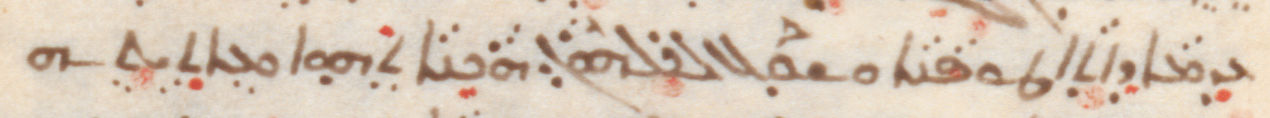ܥܕܡܐ ܕܐܬܐ ܛܘܦܢܐ ܘܫܩ̣ܠ ܠܟܠܗܘܢ܆ ܗܟܢܐ ܬܗܘܐ ܡܐܬܝܬܗ
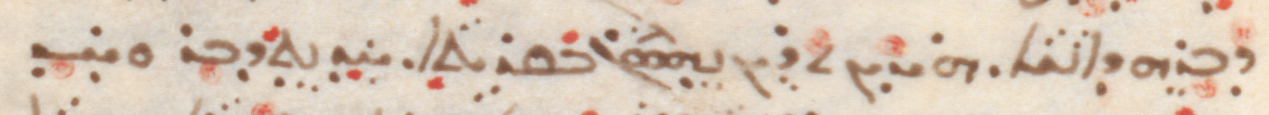ܕܒܪܗ ܕܐܢܫܐ. ܗܝܕܝܢ ܬܪܝܢ ܢܗܘܘܢ ܒܩܪܝܬܐ. ܚܕ ܢܬܕܒܪ ܘܚܕ
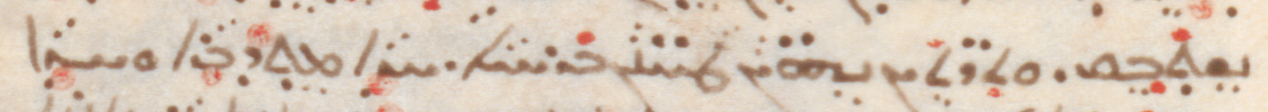ܢܫܬܒܩ. ܘܬܪ̈ܬܝܢ ܢܗܘ̈ܝܢ ܛܚ̈ܢܢ ܒܪܚܝܐ. ܚܕܐ ܡܬܕܒܪܐ ܘܚܕܐ
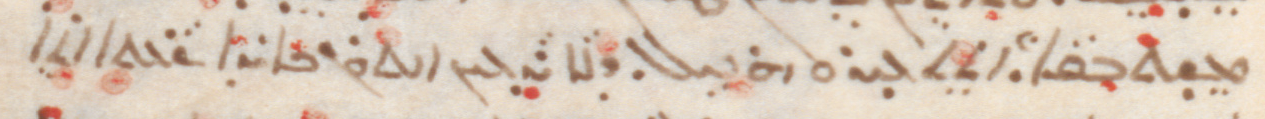ܡܫܬܒܩܐ. ܐܬܬܥܝܪܘ ܗܟܝܠ. ܕܠܐ ܝܕܥܝܢ ܐܢܬܘܢ ܒܐܝܕܐ ܫܥܬܐ ܐܬܐ
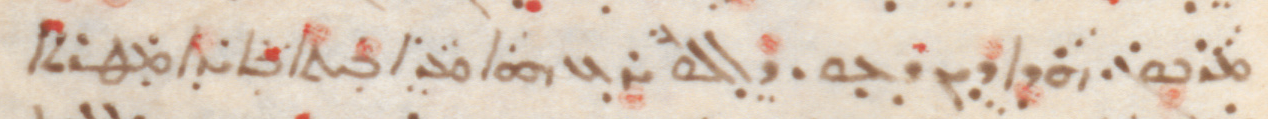ܡܪܟܘܢ. ܗܕܐ ܕܝܢ ܕܥ̣ܘ. ܕܐܠܘ ܝ̇ܕܥ ܗܘܐ ܡܪܐ ܒܝܬܐ ܒܐܝܕܐ ܡܛܪܬܐ
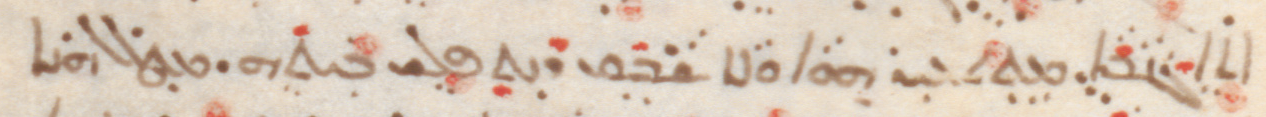ܐܬܐܓܢܒܐ ܡܬܬܥܝܪ ܗܘܐ ܘܠܐ ܫ̇ܒܩ ܕܢܬܦܠܫ ܒܝܬܗ. ܡܛܠ ܗܢܐ
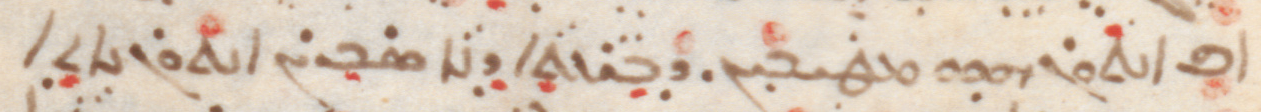ܐܦ ܐܢܬܘܢ ܗܘܘ ܡܛܝܒܝܢ. ܕܒܫܥܬܐ ܕܠܐ ܣ̇ܒܪܝܢ ܐܢܬܘܢ ܢܐܬܐ
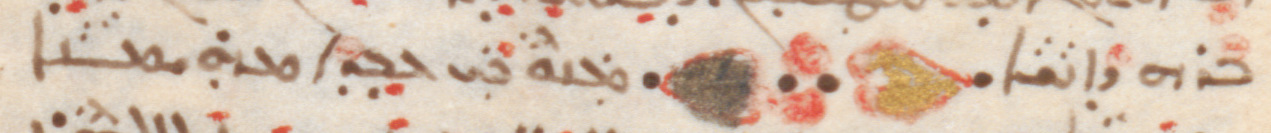ܒܪܗ ܕܐܢܫܐ܀ ܡܢܘ ܟܝ ܥܒܕܐ ܡܗܝܡܢܐ
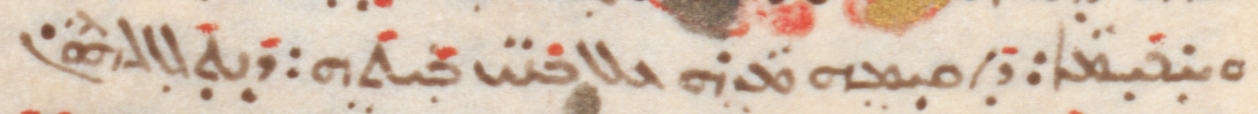ܘܚܟܝܡܐ: ܕܐܩܝܡܗ ܡܪܗ ܥܠ ܒܢ̈ܝ ܒܝܬܗ: ܕܢܬܠ ܠܗܘܢ
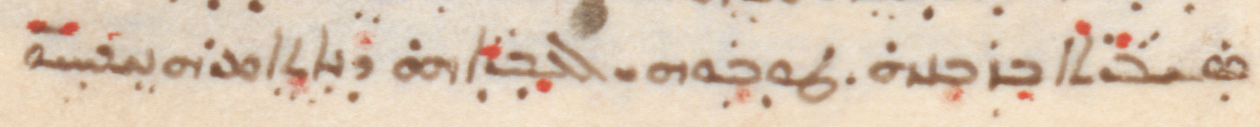ܣܝܒܪܬܐ ܒܙܒܢܗ̇. ܛܘܒܘܗܝ ܠܥܒܕܐ ܗ̇ܘ ܕܢܐܬܐ ܡܪܗ ܢܫܟܚܝܘ
